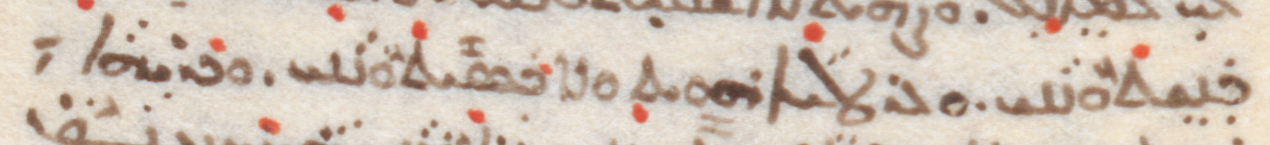ܟܢܫܬܘܢܢܝ. ܘܥܪܛܠܝܐ ܗܘܝܬ ܘܠܐ ܟܣܝܬܘܢܢܝ. ܘܟܪܝܗܐ
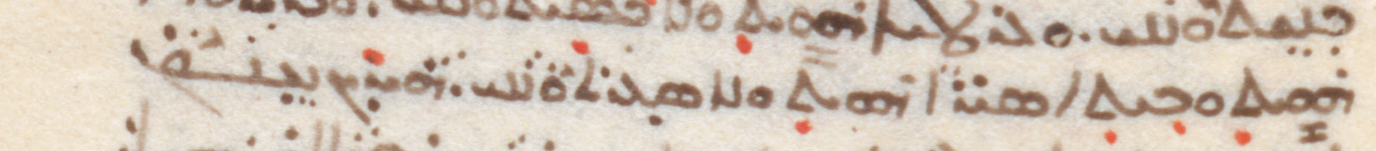ܗܘܝܬ ܘܒܝܬ ܐܣܝܪ̈ܐ ܗܘܝܬ ܘܠܐ ܣܥܪܬܘܢܢܝ. ܗܝܕܝܢ ܢܥܢܘܢ
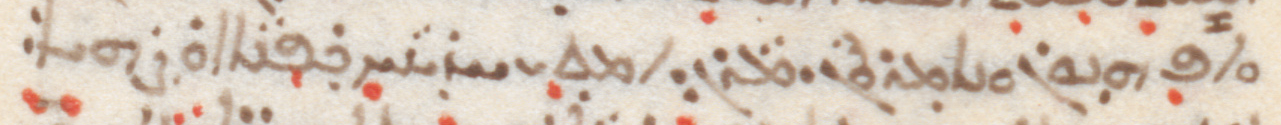ܘܐܦ ܗܢܘܢ ܘܢܐܡܪܘܢ ܡܪܢ: ܐܡܬܝ ܚܙܝܢܟ ܟܦܢܐ ܐܘܨܗܝܐ
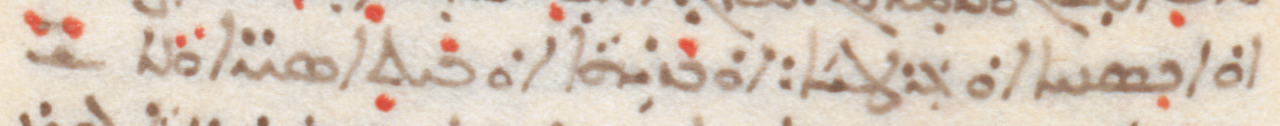ܐܘ ܐܟܣܢܝܐ ܐܘ ܥܪܛܠܝܐ: ܐܘ ܟܪܝܗܐ ܐܘ ܒܝܬ ܐܣܝܪ̈ܐ ܘܠܐ ܏ܫ
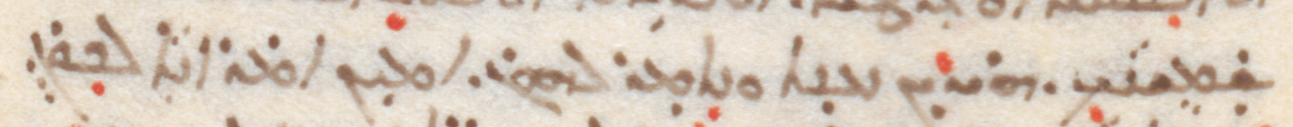ܫܡܫܢܟ. ܗܝܪܝܢ ܢܥܢ̣ܐ ܘܢܐܡ̣ܪ ܠܗܘܢ: ܐܡܝܢ ܐܡ̇ܪ ܐܢܐ ܠܟܘܢ
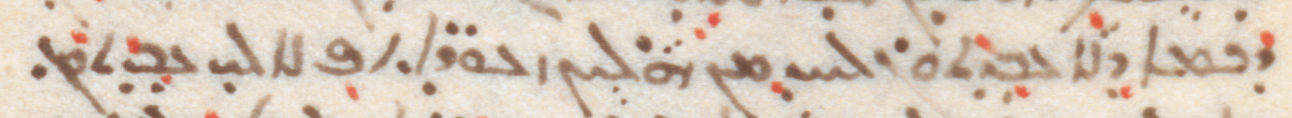ܕܟܡܐ ܕܠܐ ܥܒܕܬܘܢ ܠܚܕ ܡܢ ܗܠܝܢ ܙܥܘܪ̈ܐ. ܐܦ ܠܐ ܠܝ ܥܒܕܬܘܢ:
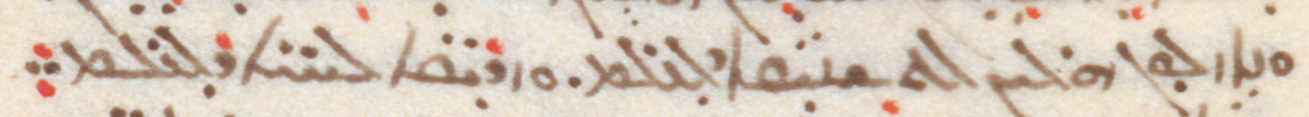ܘܢܐܙܠܘܢ ܗܠܝܢ ܠܬܫܢܝܩܐ ܕܠܥܠܡ. ܘܙܕܝܩ̈ܐ ܠܚܝܐ ܕܠܥܠܡ܀
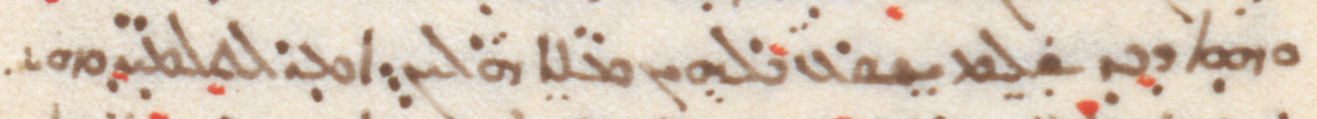ܘܗܘܐ ܕܟܕ ܫܠܡ ܝܫܘܥ ܟܠܗܝܢ ܡ̈ܠܐ ܗܠܝܢ܆ ܐܡ̣ܪ ܠܬܠܡ̈ܝܕܘܗܝ
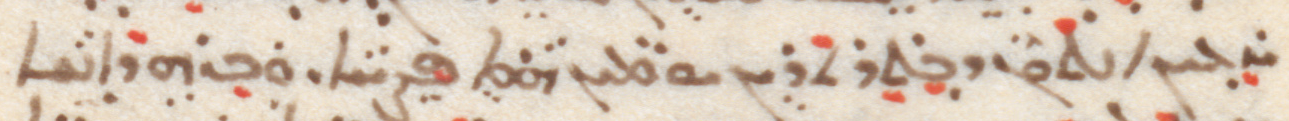ܝ̇ܕܥܝܢ ܐܢܬܘܢ ܕܒܬܪ ܬܪܝܢ ܝܘܡ̈ܝܢ ܗܘܐ ܦܨܚܐ. ܘܒܪܗ ܪܐܢܫܐ
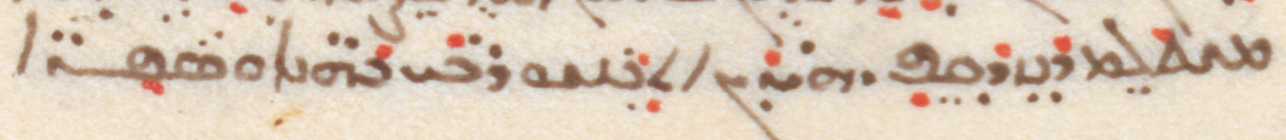ܡܫܬܠܡ ܕܢܙܕܩܦ. ܗܝܕܝܢ ܐܬܟܢܫܘ ܪ̈ܒܝ ܟܗ̈ܢܐ ܘܣܦܪ̈ܐ
